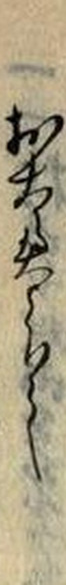於大奥被下之
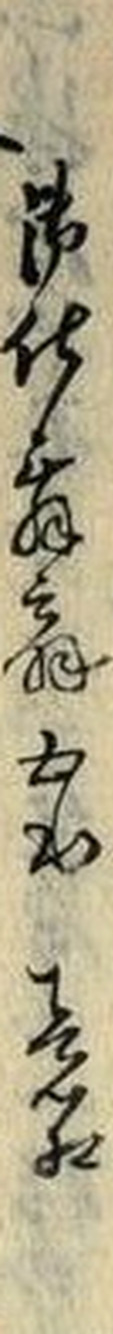御仕舞扇五本壱箱
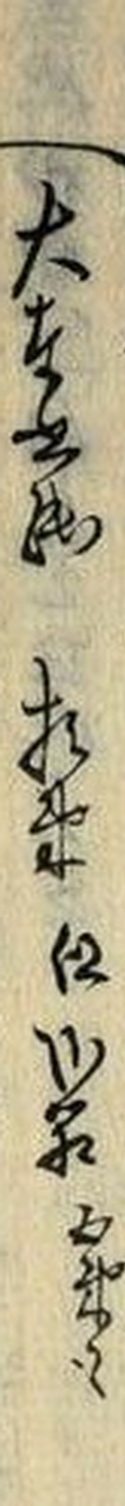大奉書紙拾束但弐箱五束ツヽ
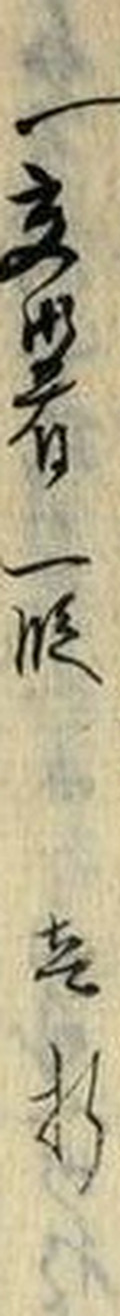交御肴一段壱折
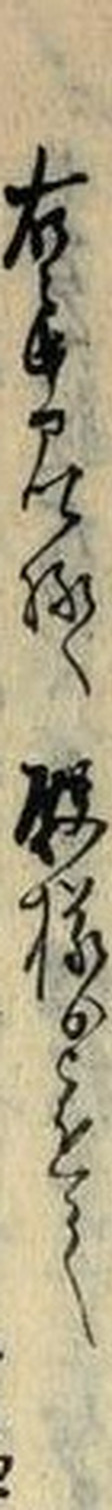右民部卿様へ殿様ゟ被進之
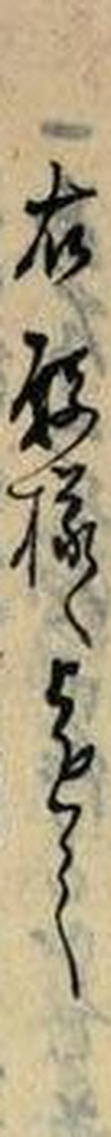右殿様へ被進之
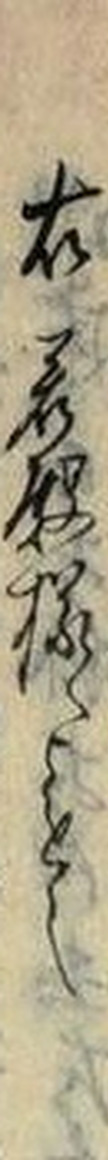右若殿様へ被進之
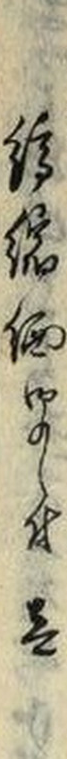縞縮緬御のし付壱
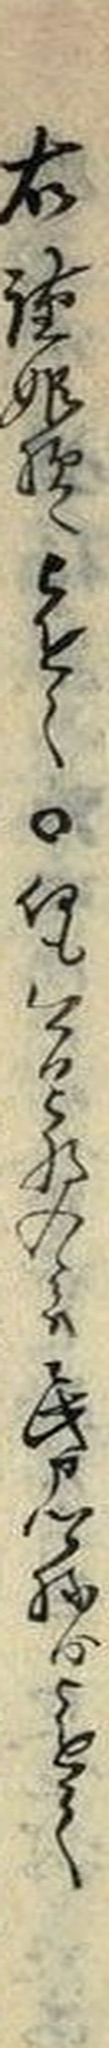右謹姫様へ被進之〇何も今日被為入候ニ付民部卿様ゟ被進之
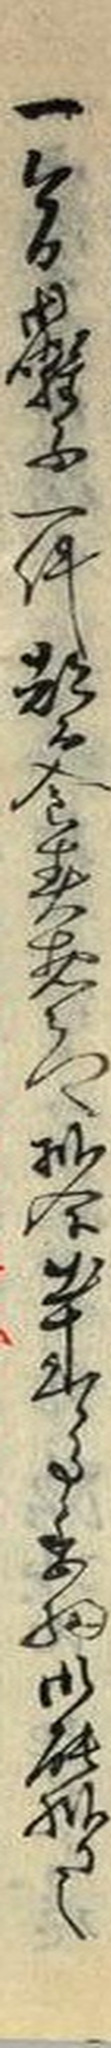一今日御囃子一件都而金春惣右衛門へ掛合出来候事委細御能掛り之
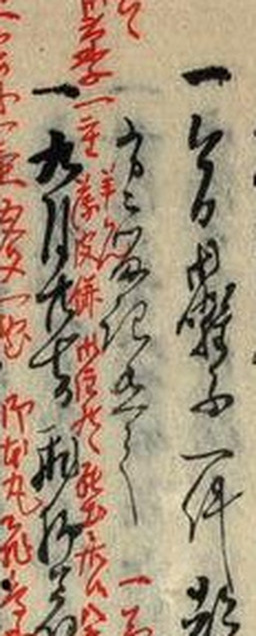方ニ留記有之
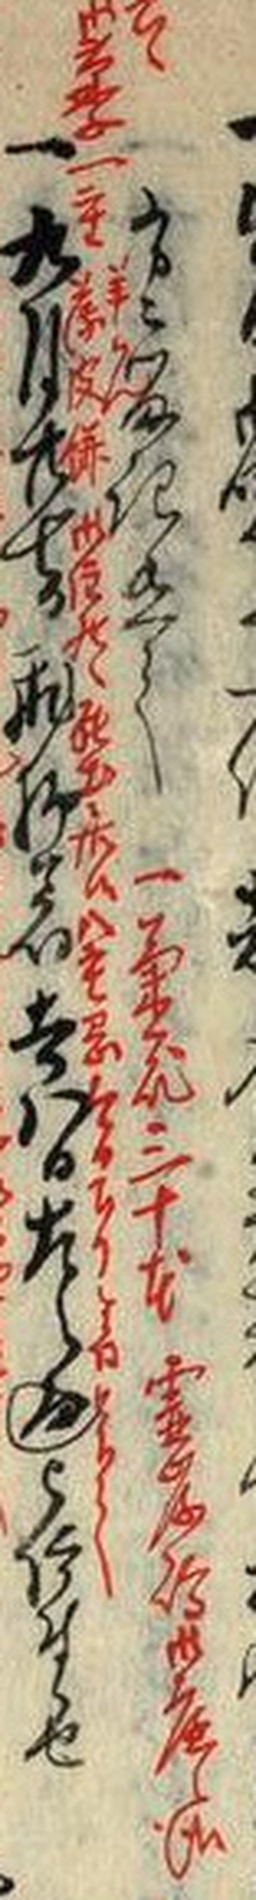一九月廿七日飛脚着去八日左之通被仰付候由
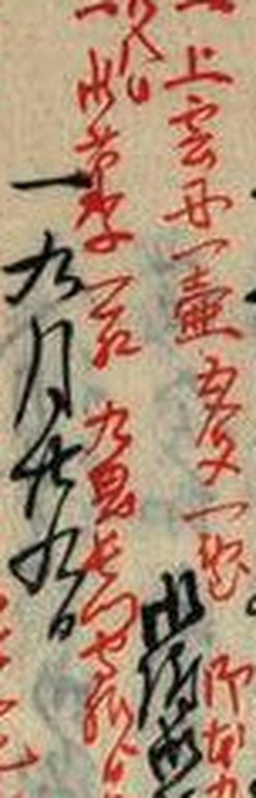一九月廿九日
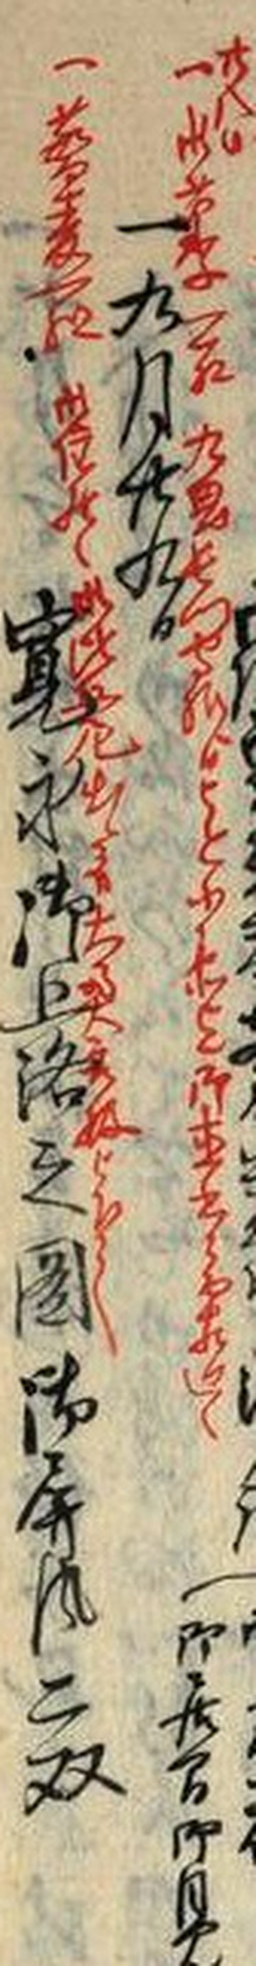寛永御上洛之図御屏風二双
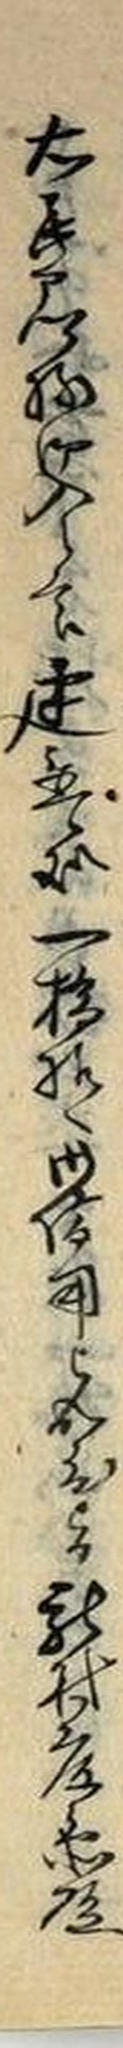右民部卿様御入之節建置候処一橋様へ御借用被成度旨新村藤兵衛殿

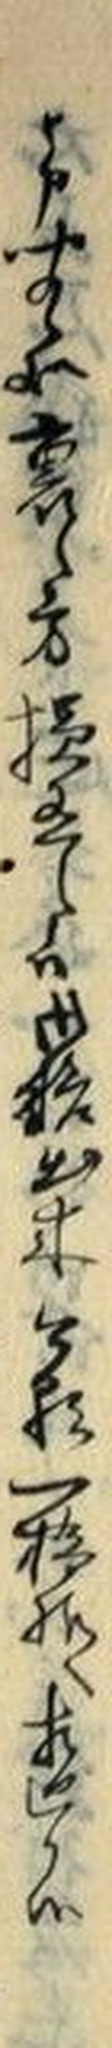被申聞候処裏之方損有候ニ付御繕出来今朝一橋様へ相廻り候
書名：少傅日録抄（斉承付側向頭取日記、在府）
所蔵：福井県文書館 Fukui Prefectural Archives
